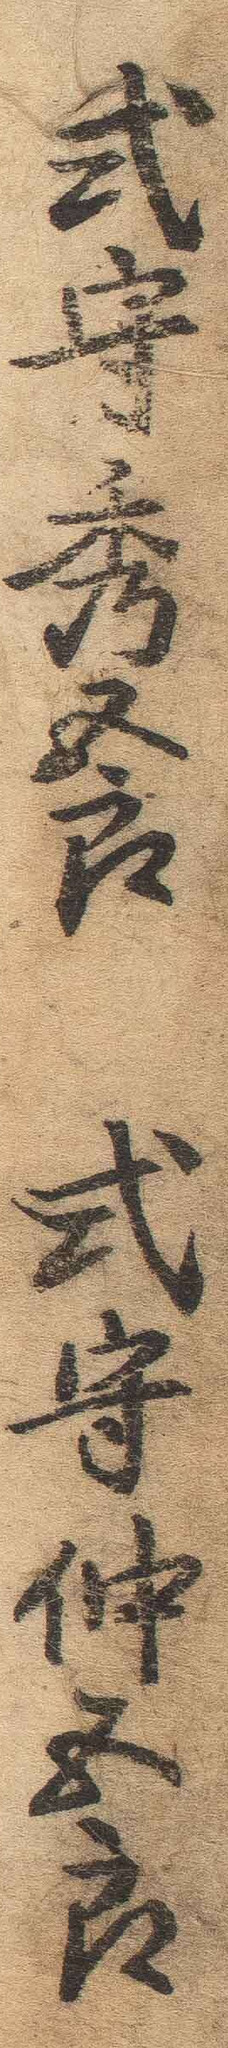式守秀五郎式守仲五郎
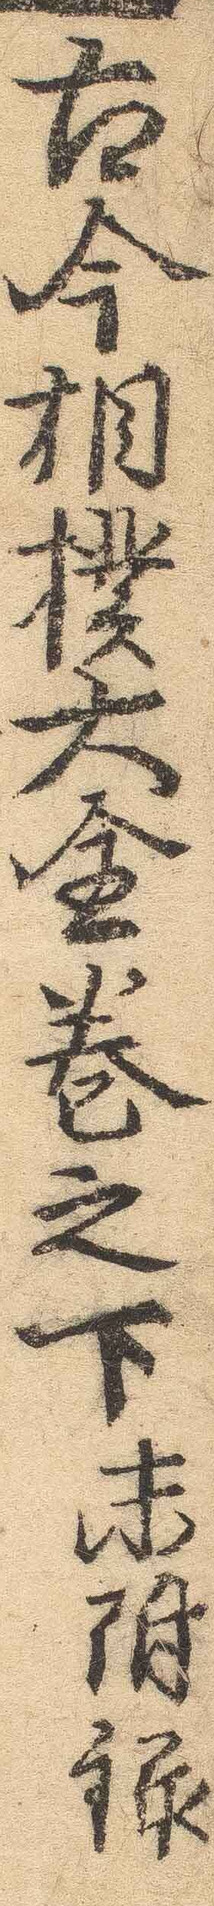古今相撲大全巻之下未附録
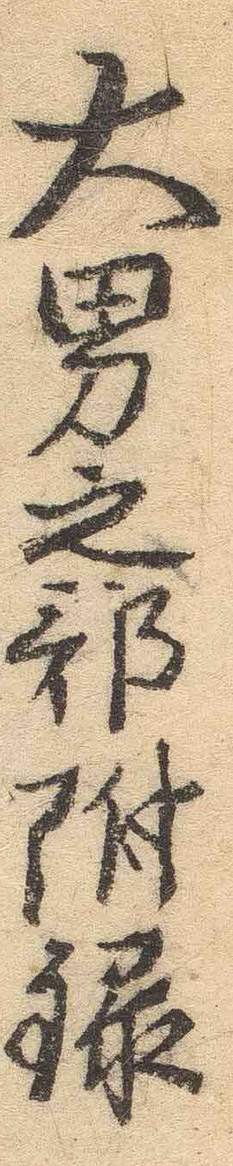大男之部附録
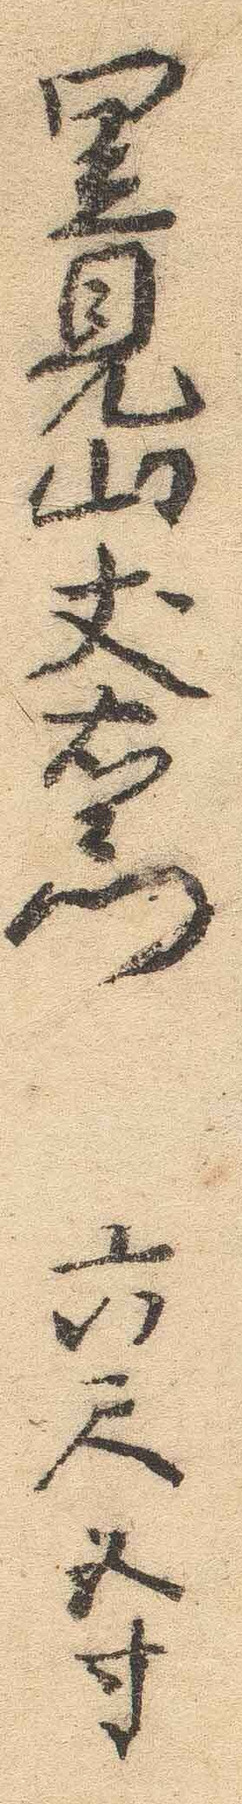里見山丈右衛門六尺五寸
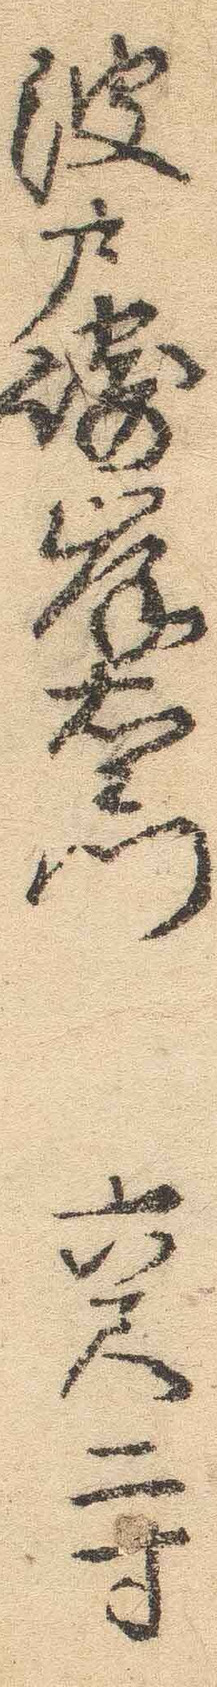波戸崎岸右衛門六尺二寸
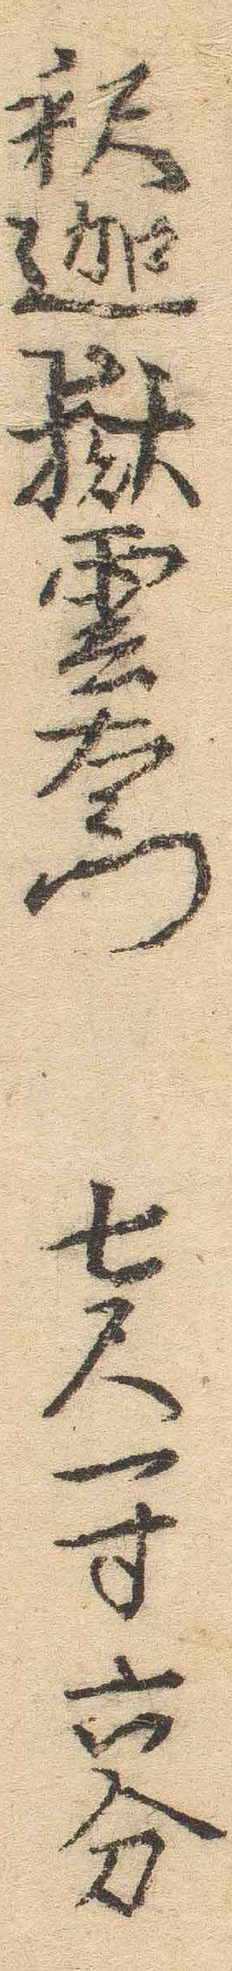釈迦嶽雲右衛門七尺一寸六分
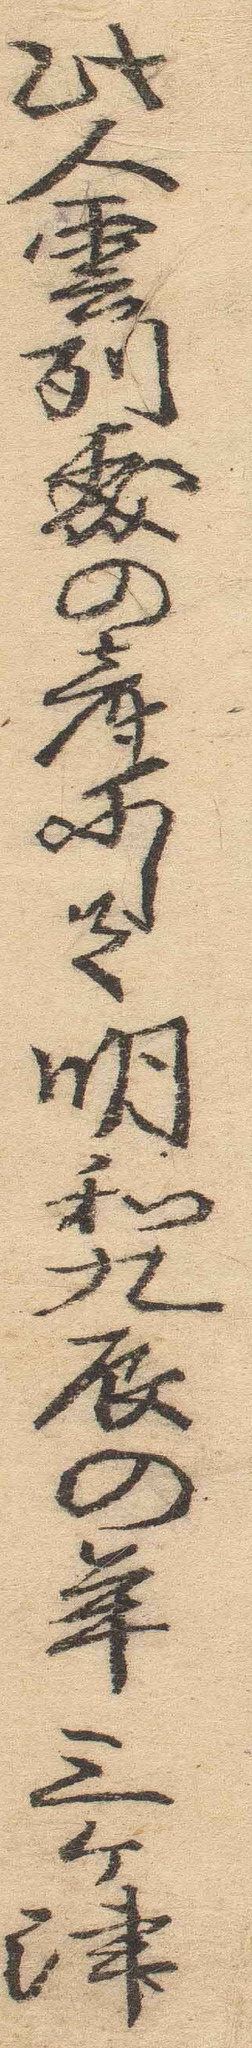此人雲州森の産にて明和明和九辰の年三ケ津
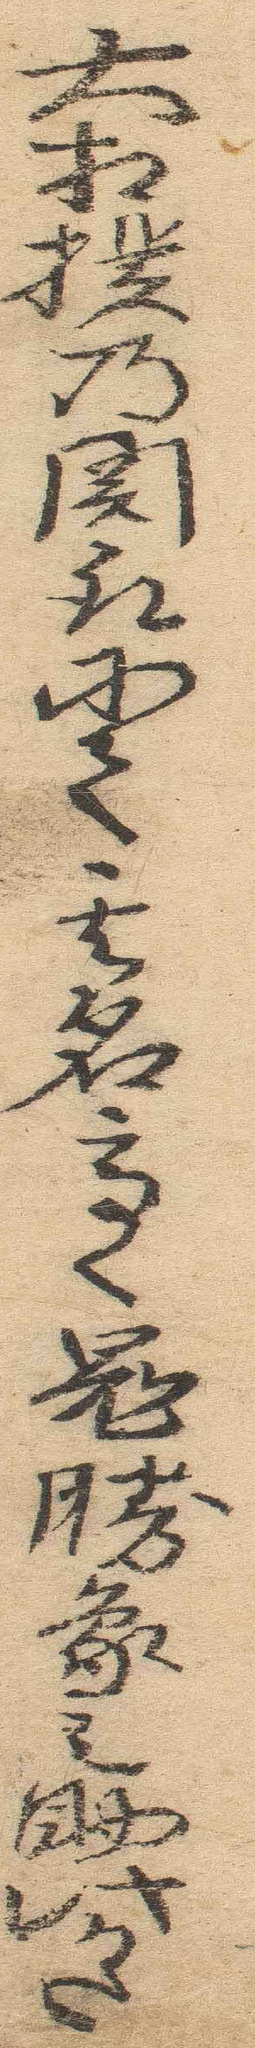大相撲の関取にて其名高く鬼勝象之助此かた
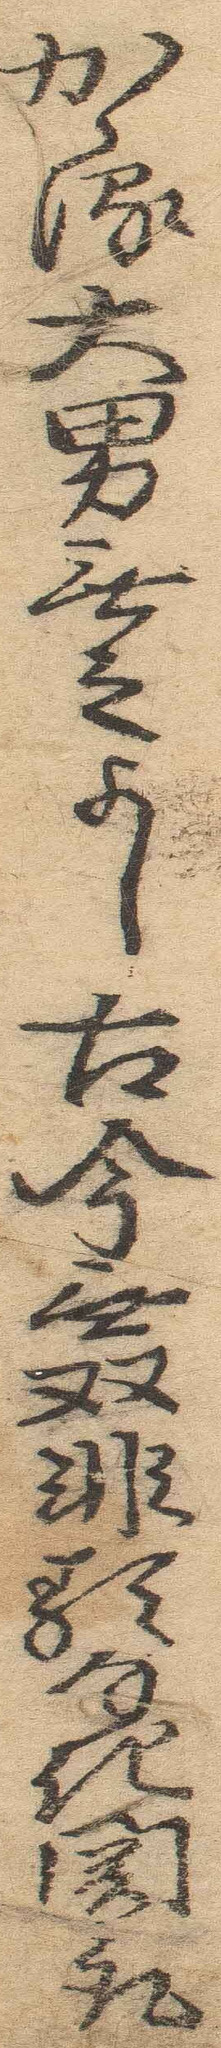かゝる大男無之よし古今無双非類なき関取

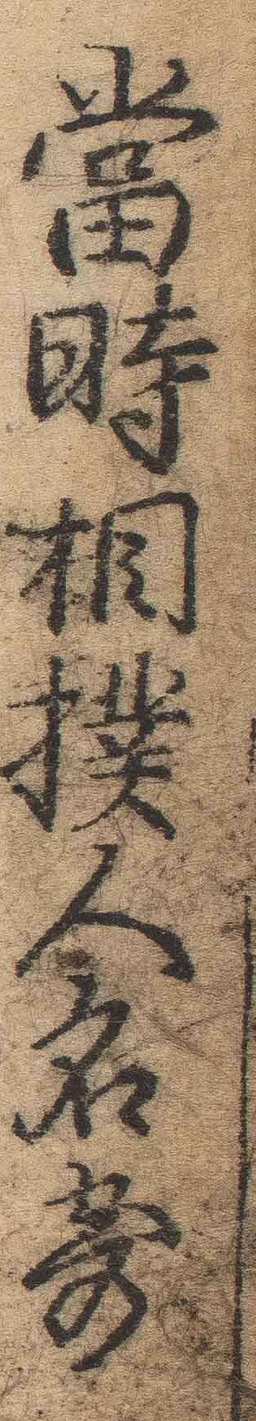当時相撲人名寄
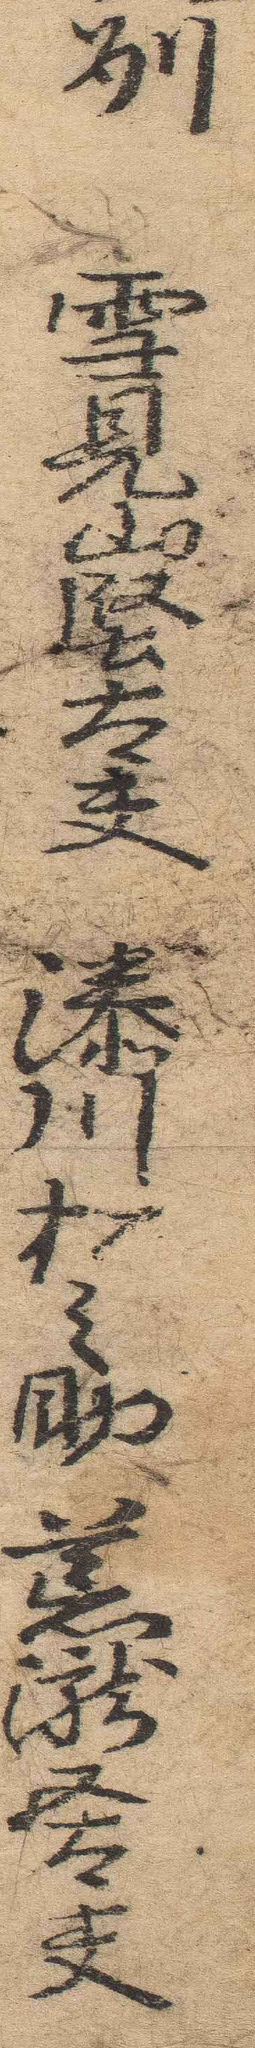九州雲見山堅太夫湊川松之助荒瀧五太夫
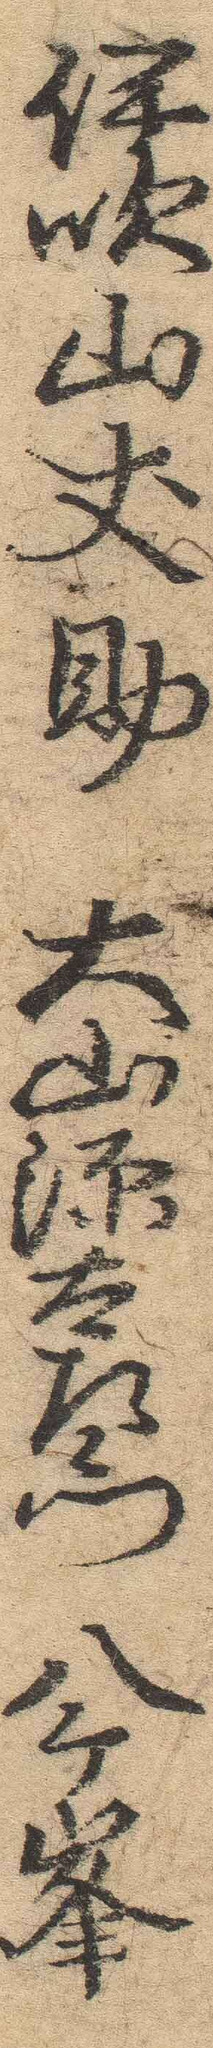伊吹山丈助大山源太左衛門八ヶ峯
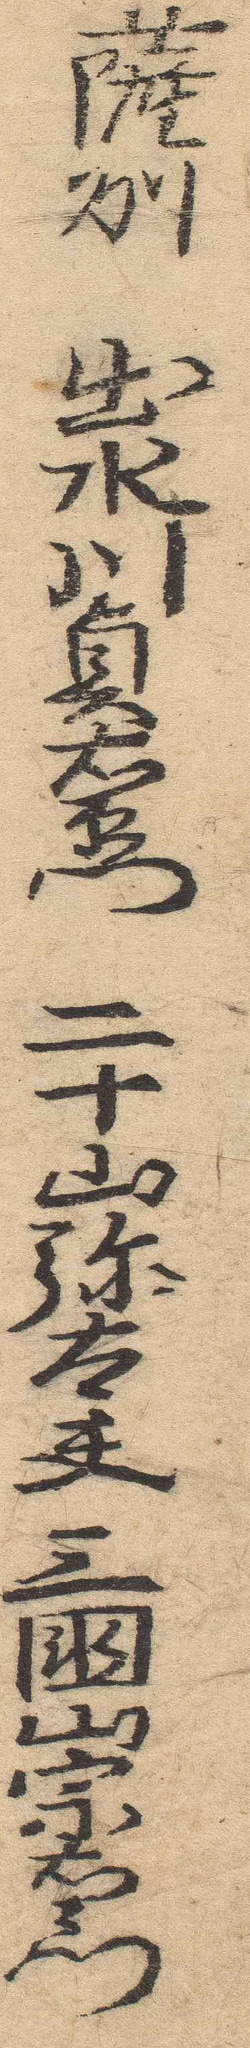薩州出水川貞右衛門二十山弥太夫三国山宗右衛門
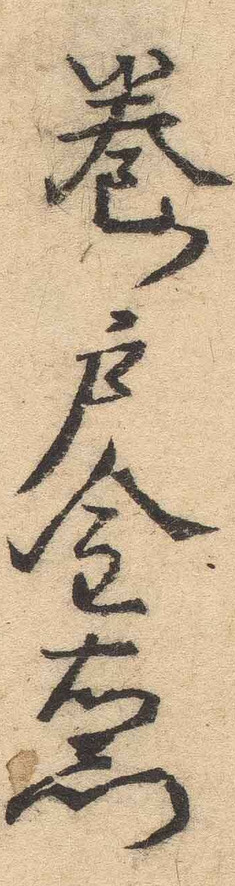巻ノ戸金右衛門
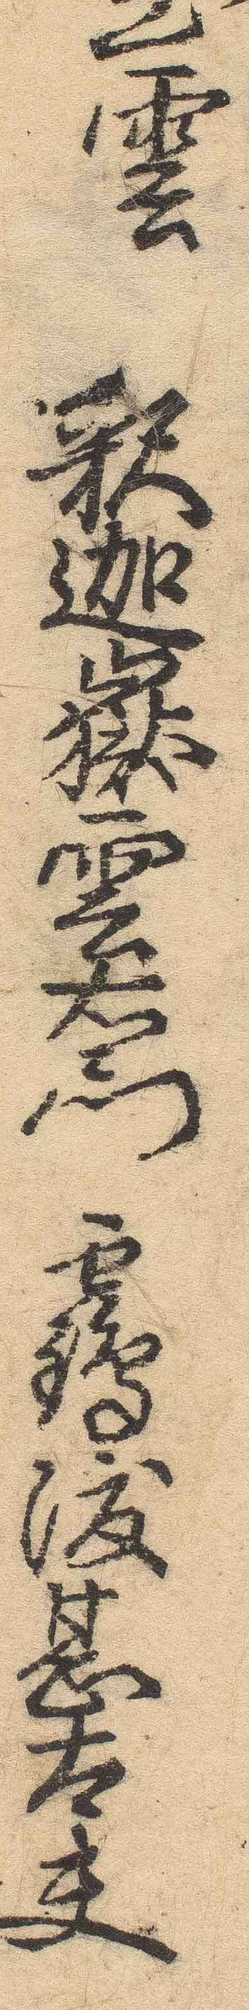出雲釈迦嶽雲右衛門鶴渡甚太夫
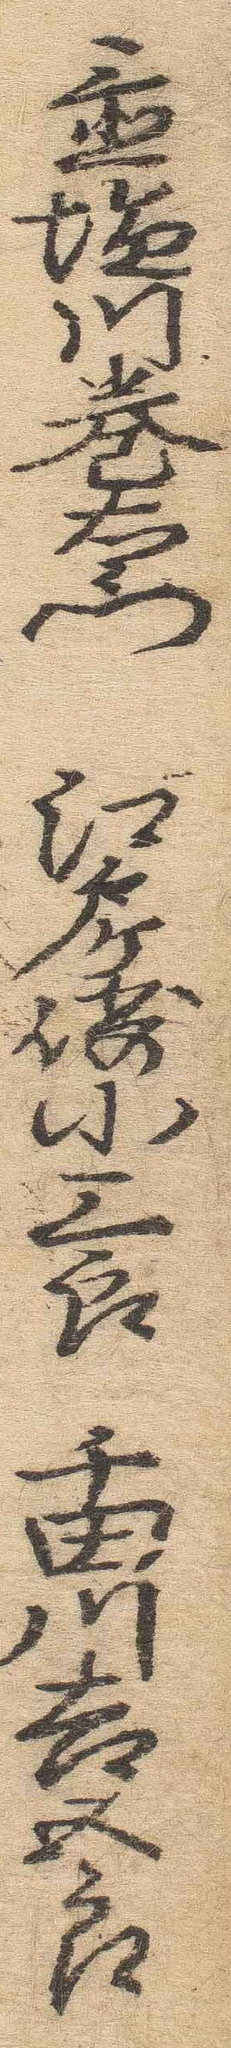大阪置塩川巻右衛門江戸ケ崎小三郎千田川吉五郎
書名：古今相撲大全
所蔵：東京学芸大学附属図書館 国文学研究資料館
